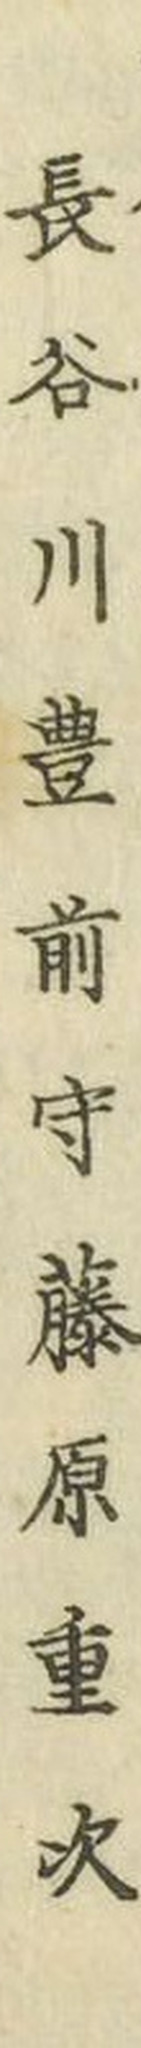長谷川豊前守藤原重次
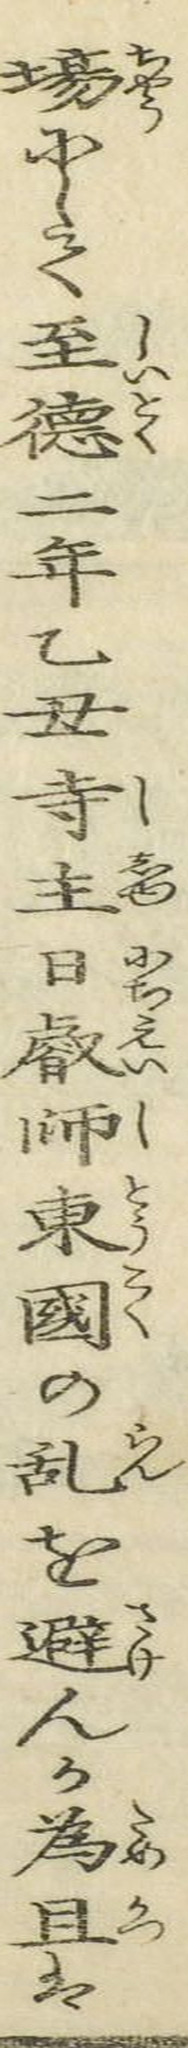塲にして至徳二年乙丑寺主日叡師東國の乱を避んか為且は
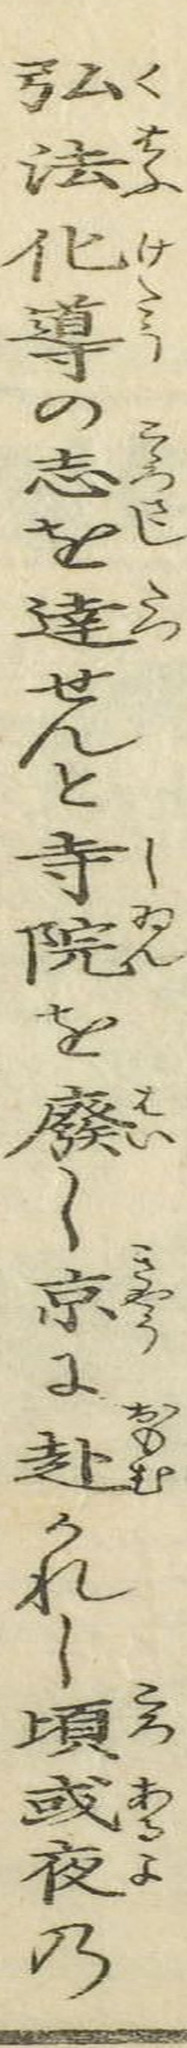弘法化導の志を達せんと寺院を廢し京に赴かれし頃或夜の
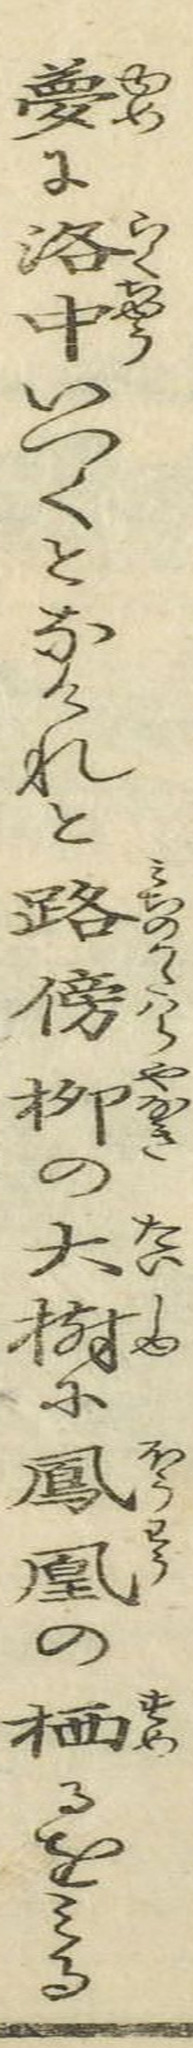夢に洛中いつくとなけれと路傍栁の大樹に鳳凰の栖るをみる
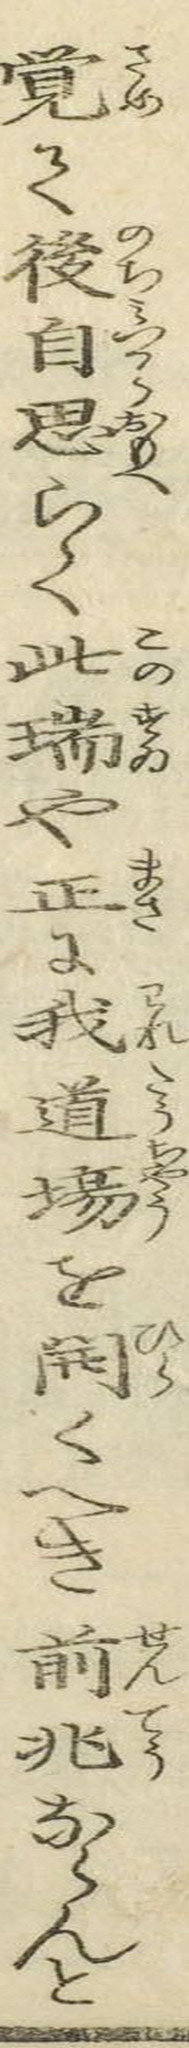覚て後自思らく此瑞や正に我道塲を開くへき前兆ならんと
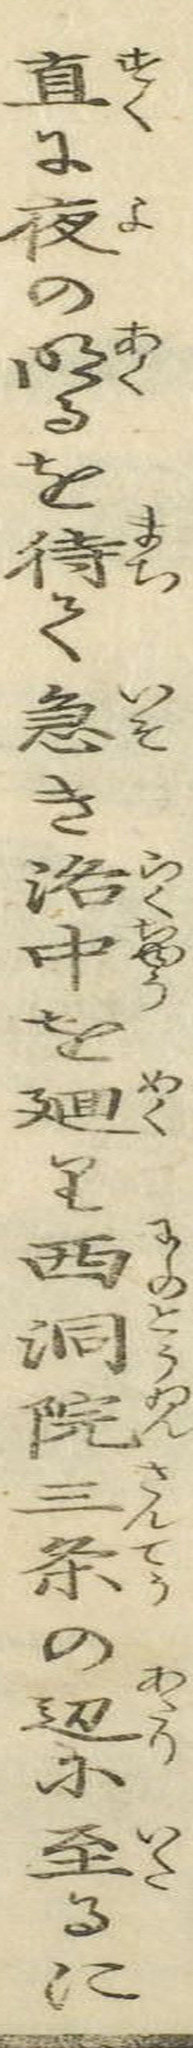直に夜の明るを待て急き洛中を廻り西桐院三条の辺に至るに
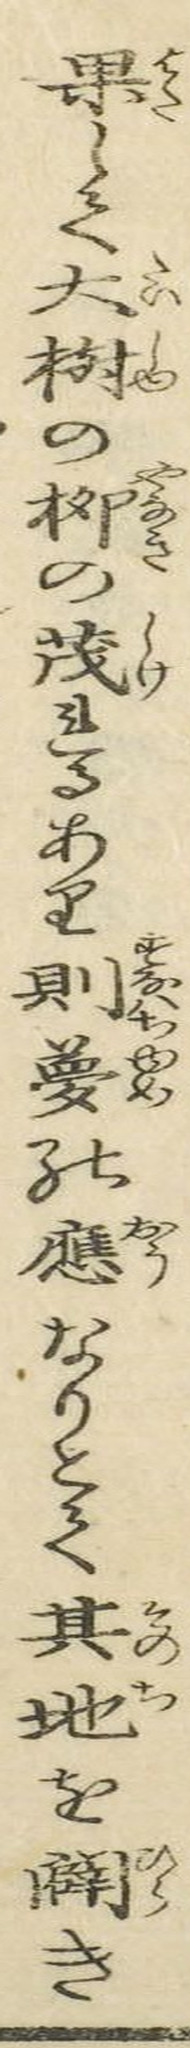果して大樹の栁の茂れるあり則夢の應なりとて其地を闢き
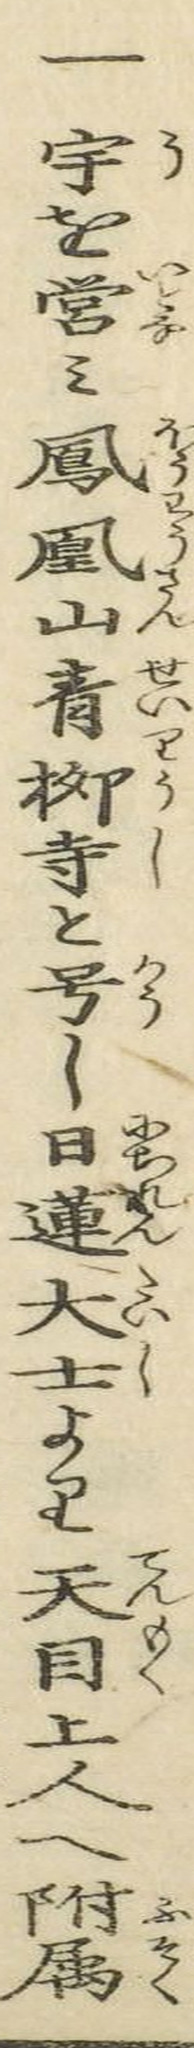一宇を営み鳳凰山青栁寺と号し日蓮大士より天目上人へ附属
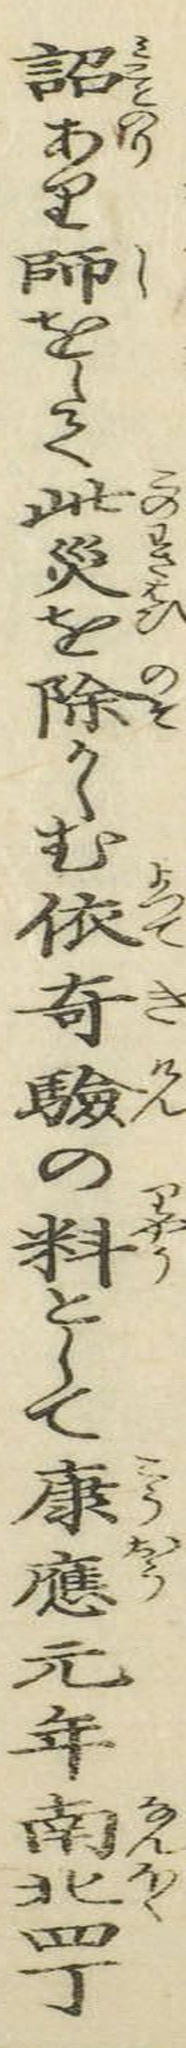詔あり師をして此災を除かしむ依奇驗の料として康應元年南北四丁
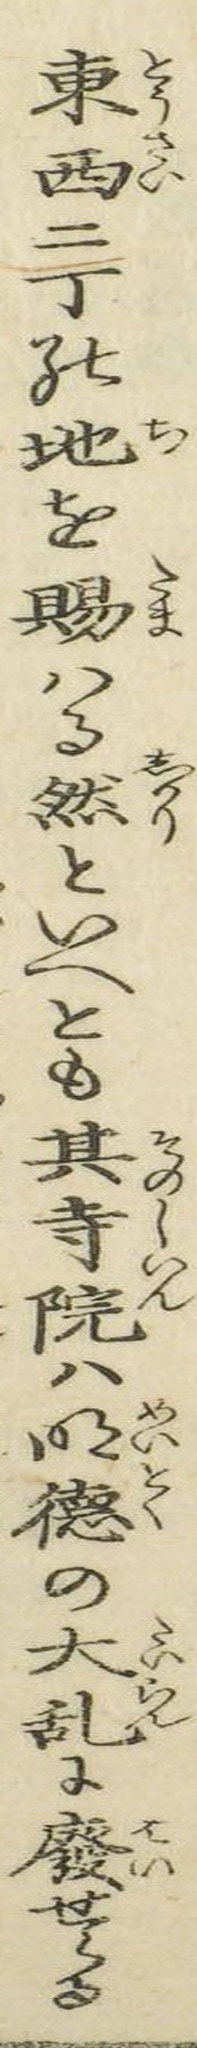東西二丁の地を賜はる然といへとも其寺院は明徳の大乱に廢せらる
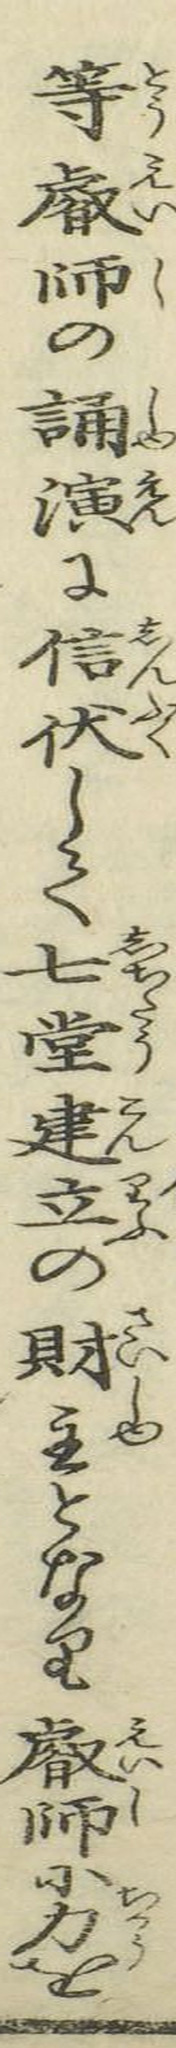等叡師の誦演に信伏して七堂建立の財主となり叡師に力を
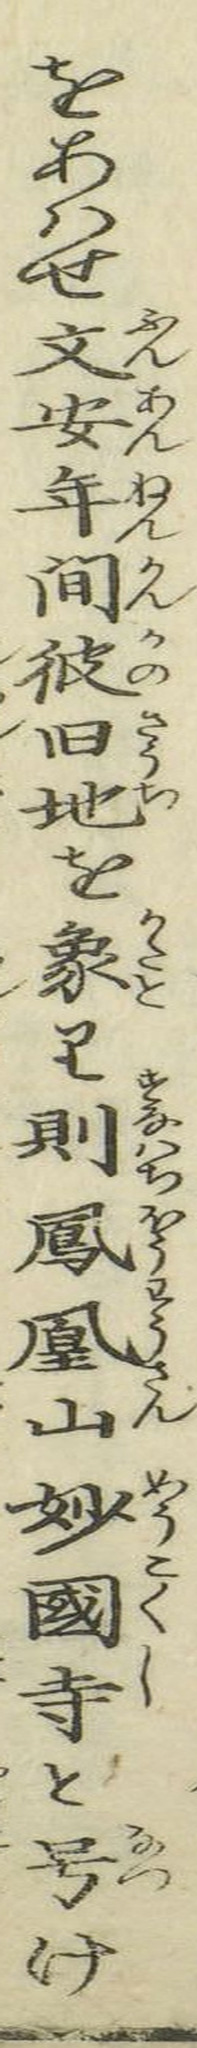をあはせ文安年間彼旧地を象り則鳳凰山妙國寺と号け

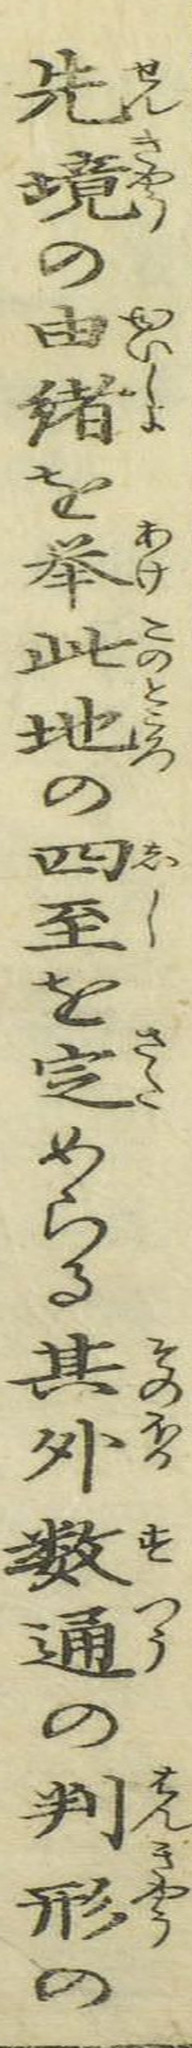先境の由緒を挙此所四至を定めらる其外数通の判形の
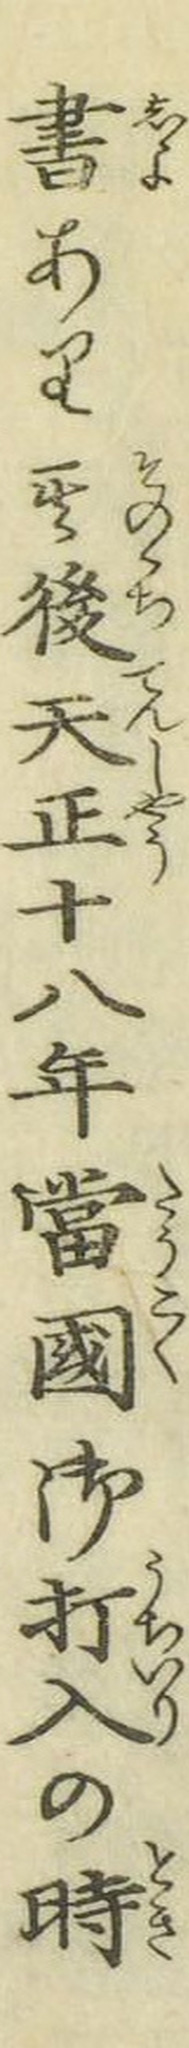書あり其後天正十八年當國御打入の時
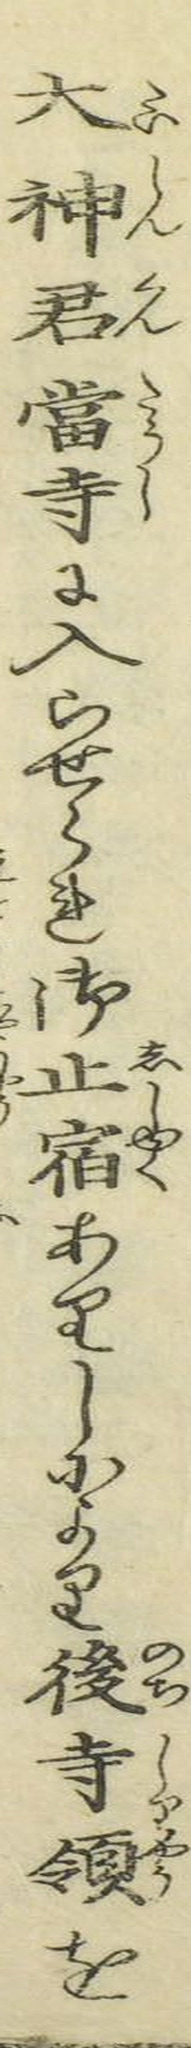大神君當寺に入らせられ御止宿ありしにより後寺領を
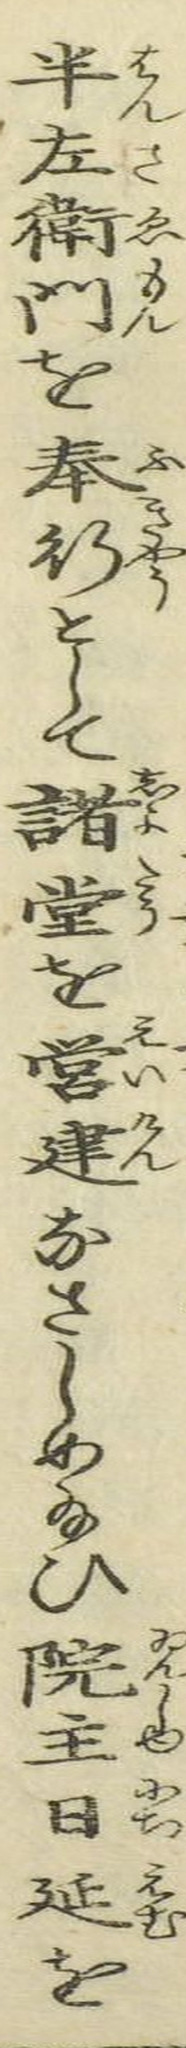半左衛門を奉行として諸堂を営建なさしめ給ひ院主日延を
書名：江戸名所図会 20巻 巻之4
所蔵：東京学芸大学教育コンテンツアーカイブ
